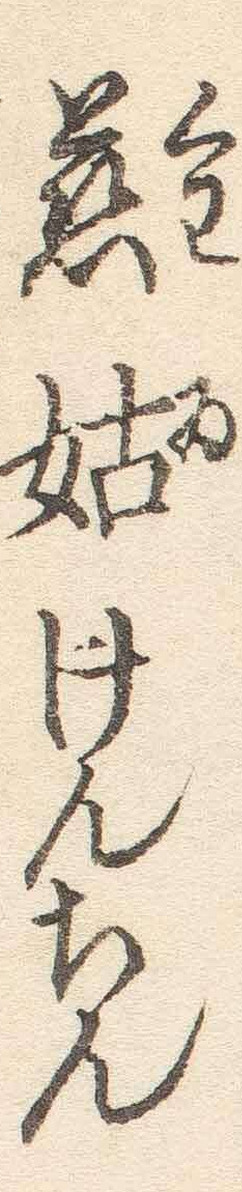慈姑けんちん
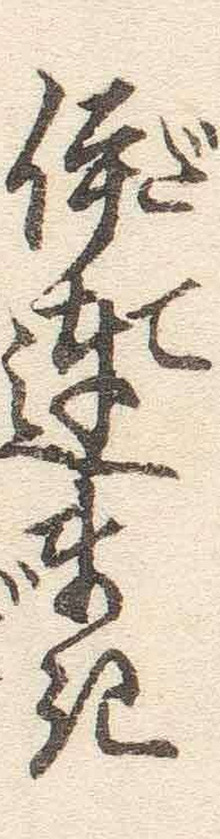伊達まき
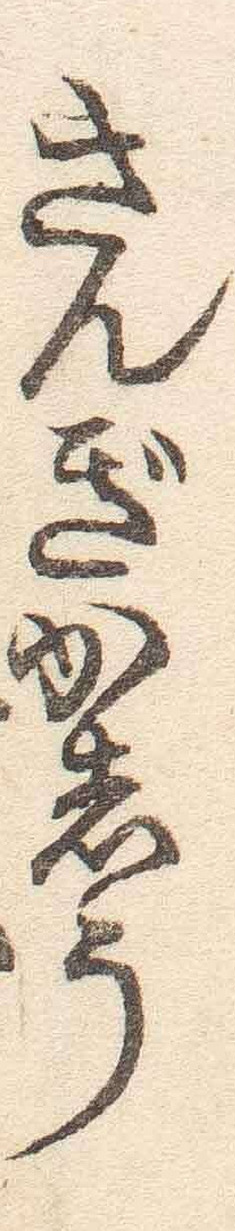さんぎかしう
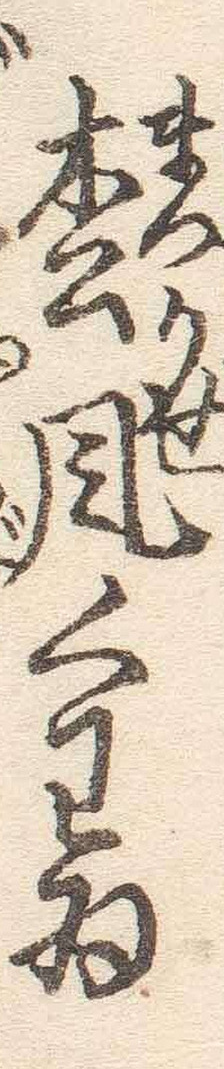松風くわゐ
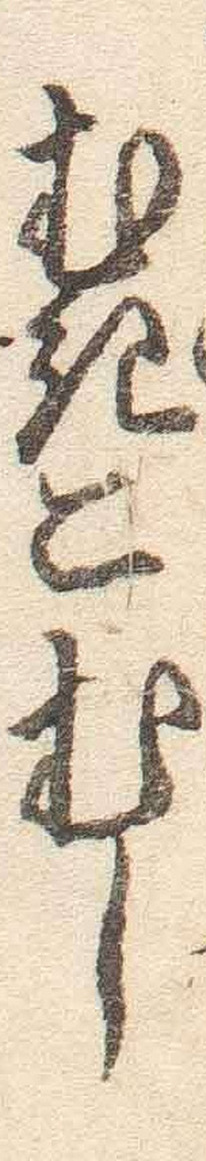むきこむし
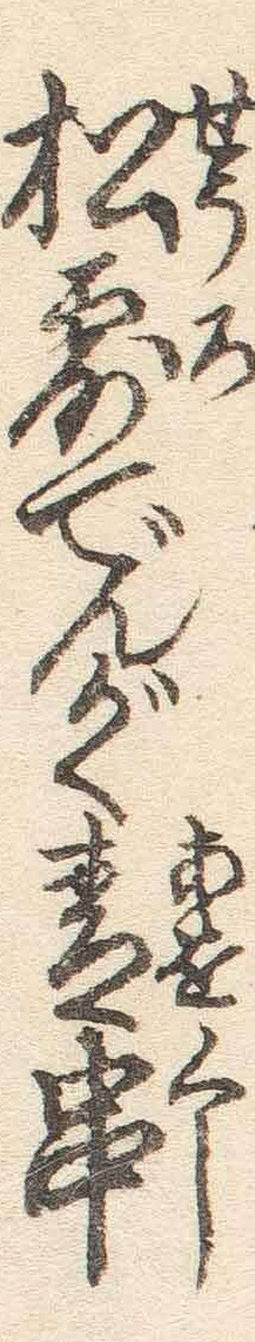松露でんがく青串
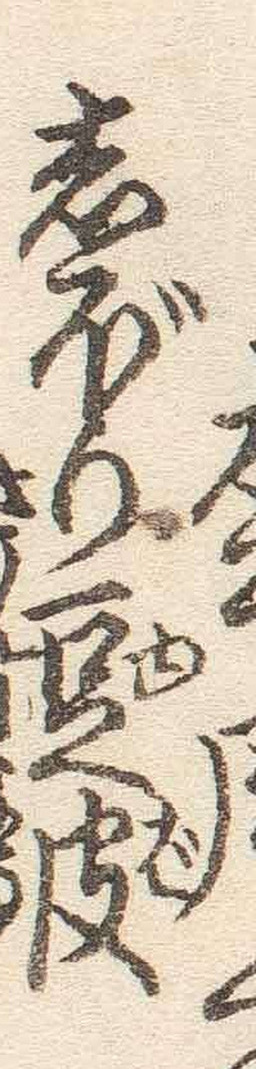しぼり豆皮
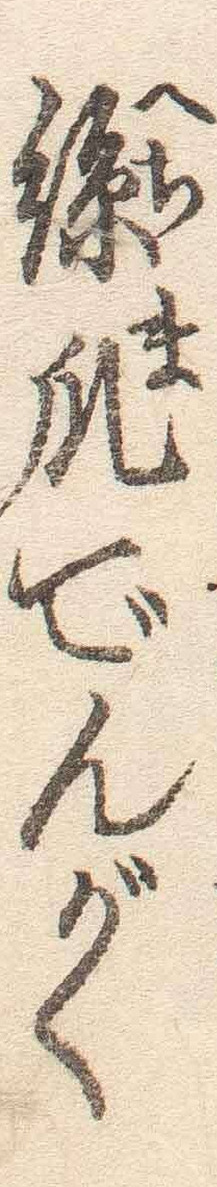糸瓜でんがく
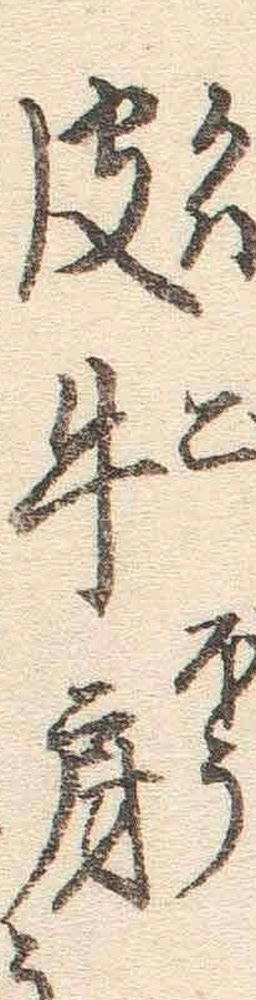皮牛蒡
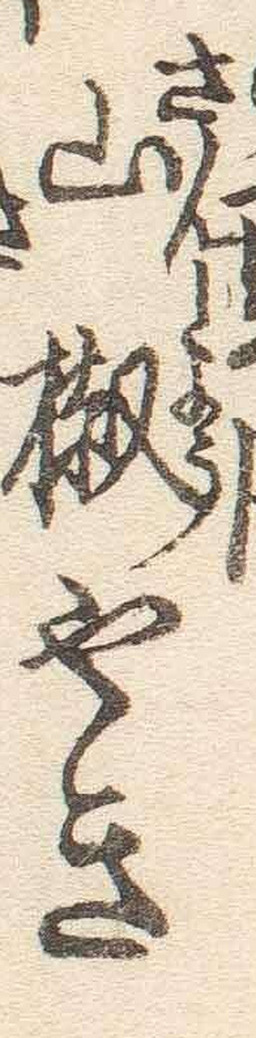山椒やき
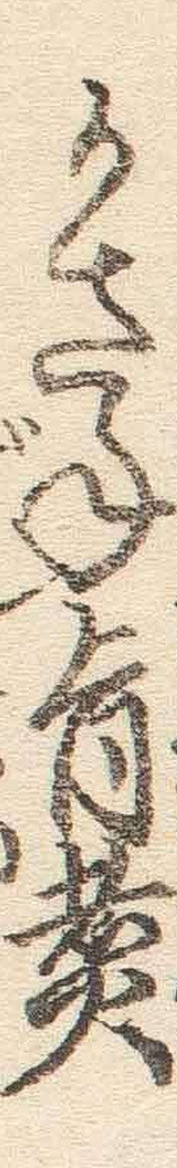かさね旨煮
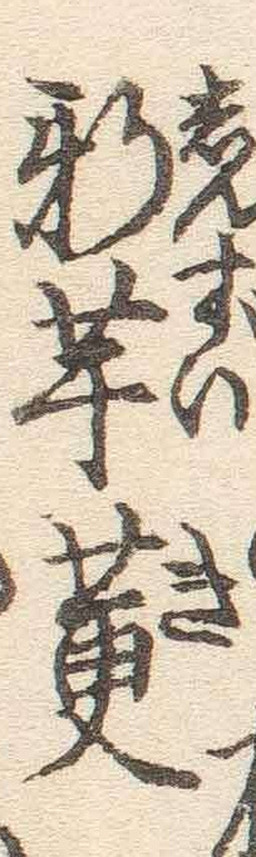新芋莄
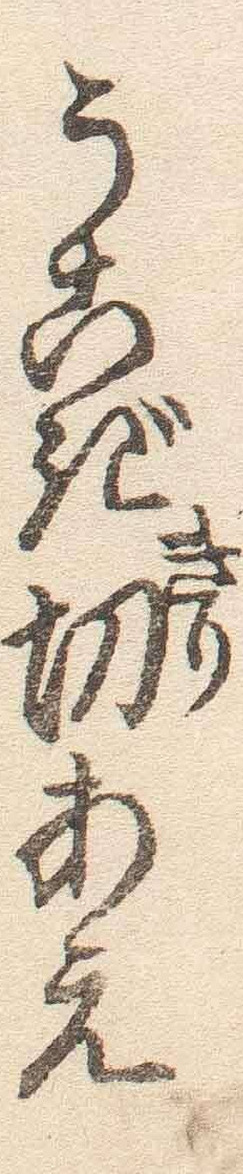うこぎ切あえ
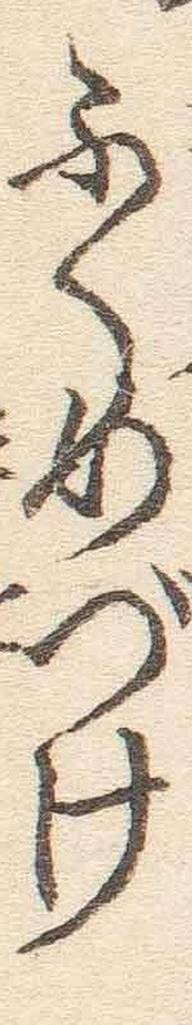ふくめづけ
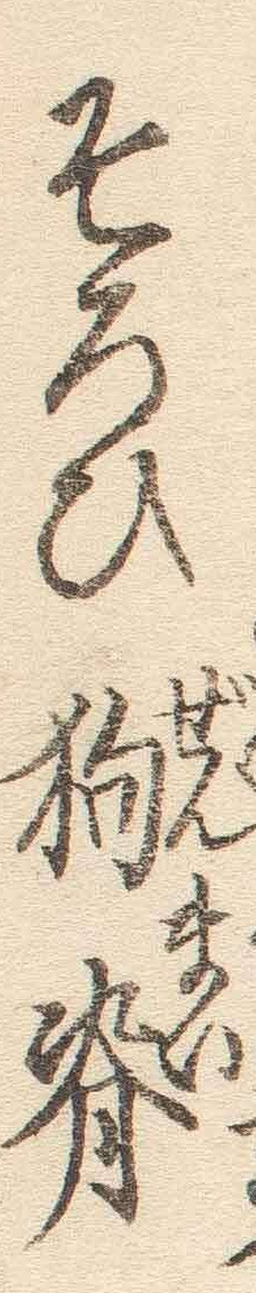そろひ狗脊
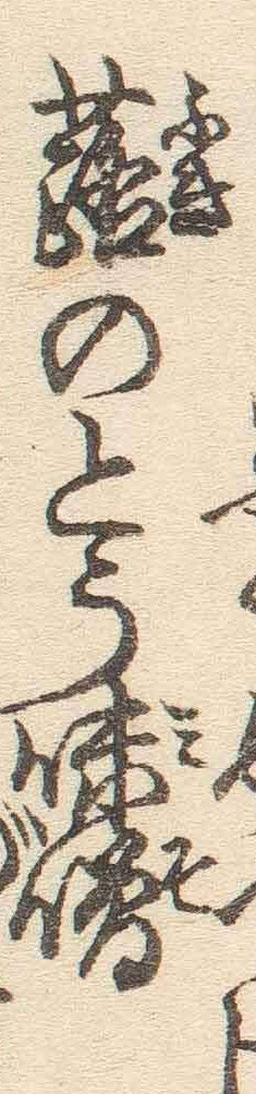蕗のとう味噌
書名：料理通
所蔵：東京学芸大学附属図書館 国文学研究資料館
